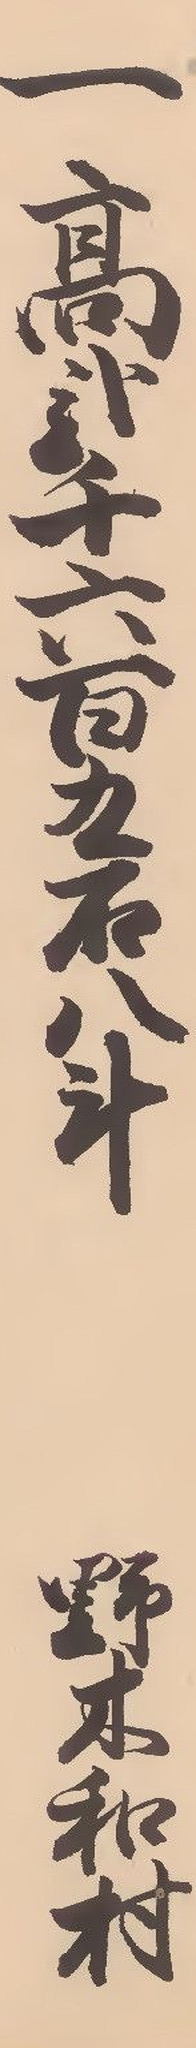一高弐千六百九石八斗野木和村
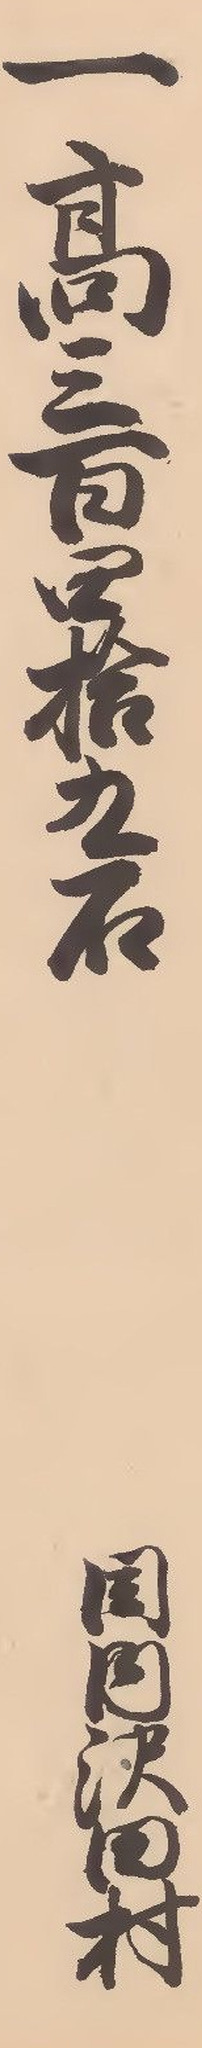一高三百四拾九石目内沢田村
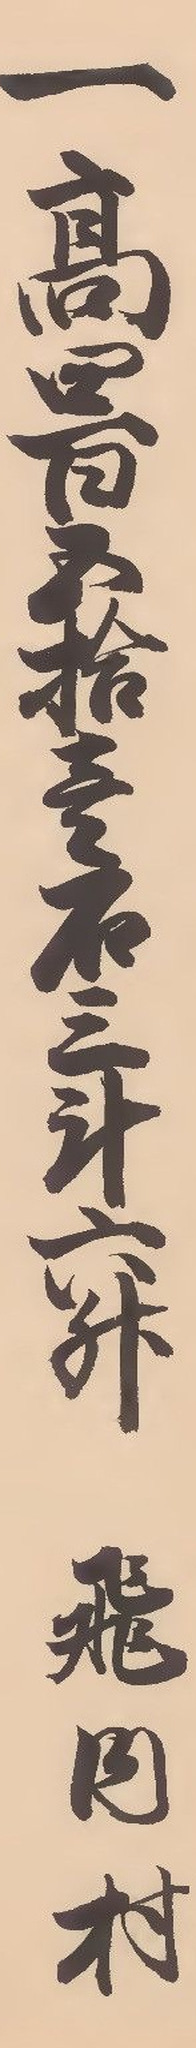一高四百五拾壱石三斗六升飛内村
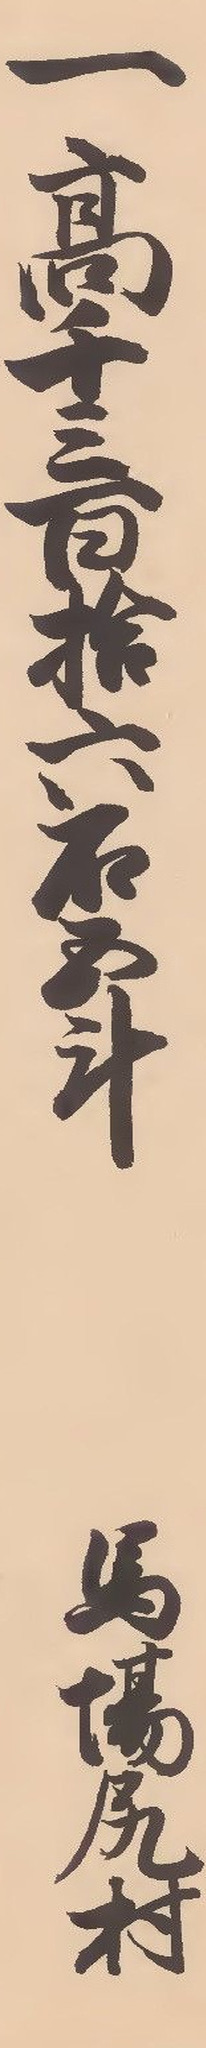一高千三百拾六石五斗馬場尻村
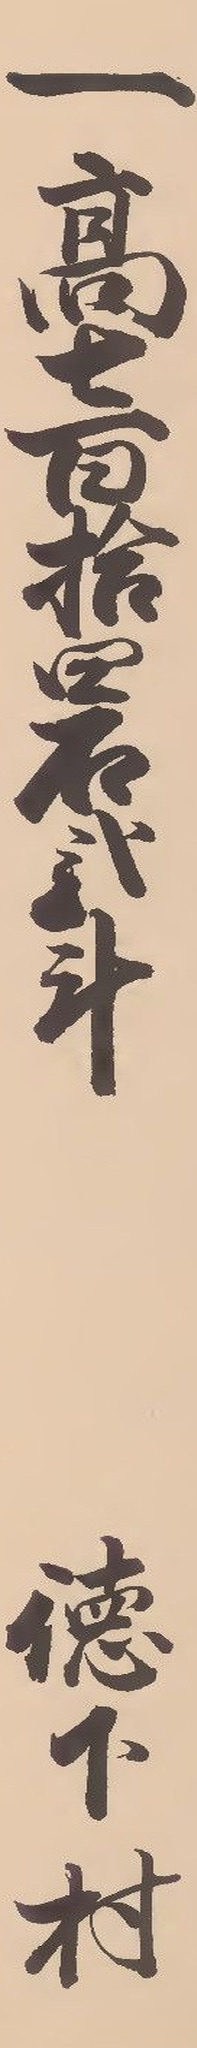一高七百拾四石弐斗徳下村
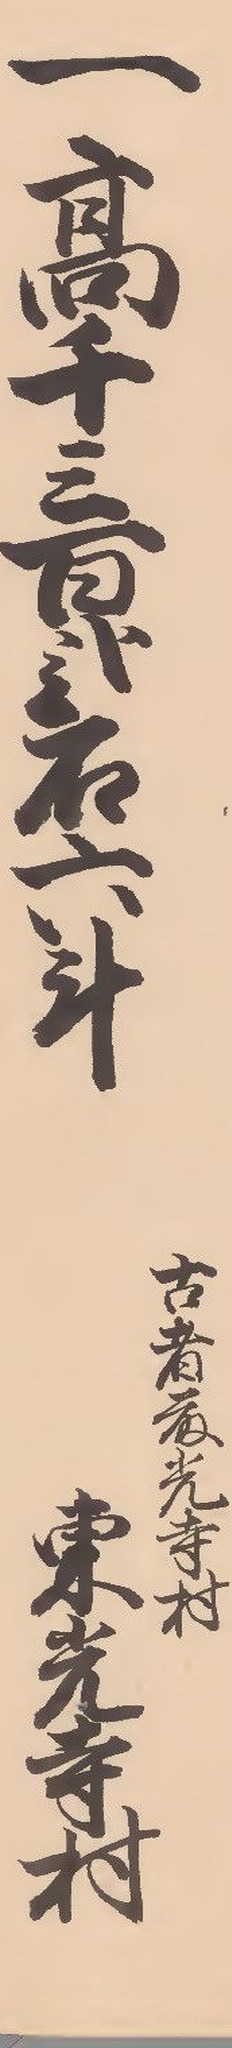一高千三百弐石六斗東光寺村

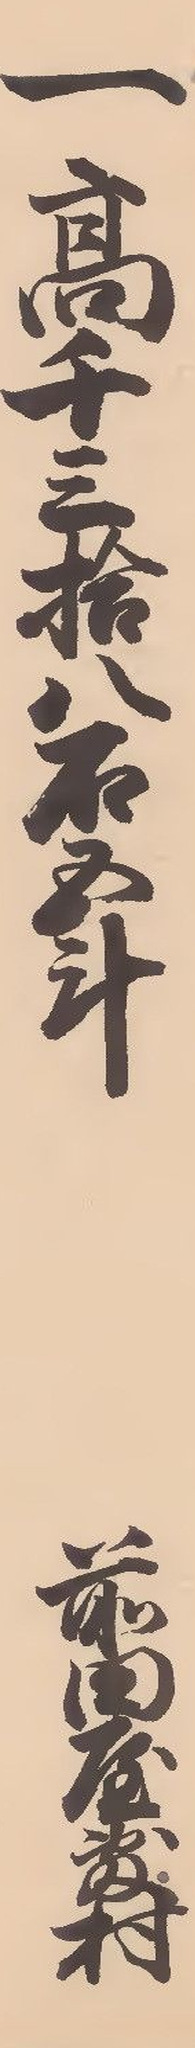一高千三拾八石五斗前田屋敷村
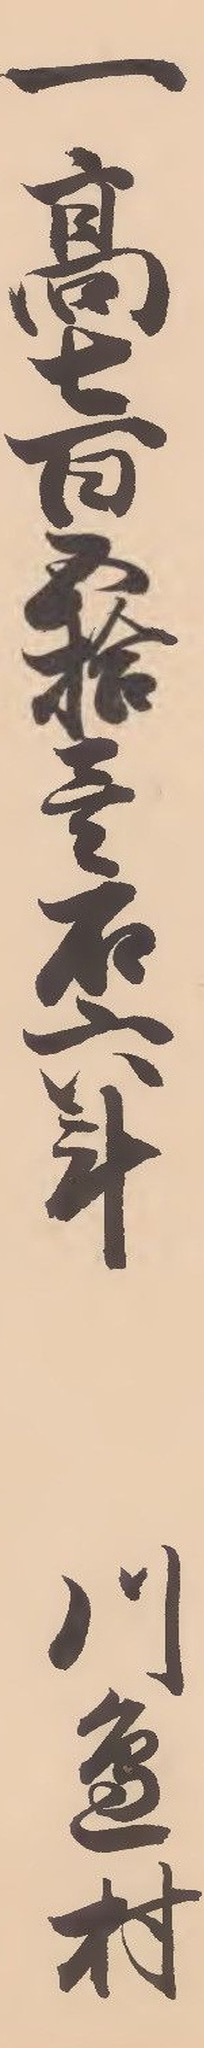一高七百五拾壱石六斗川辺村
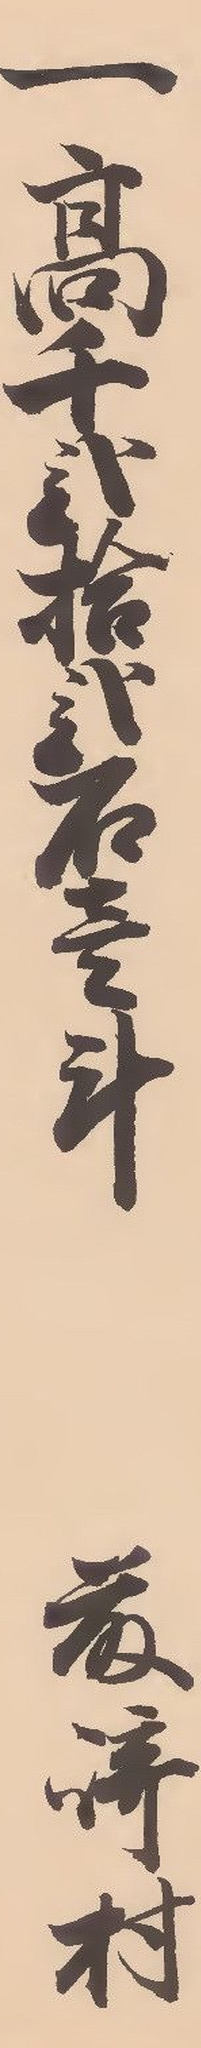一高千弐拾弐石壱斗藤崎村
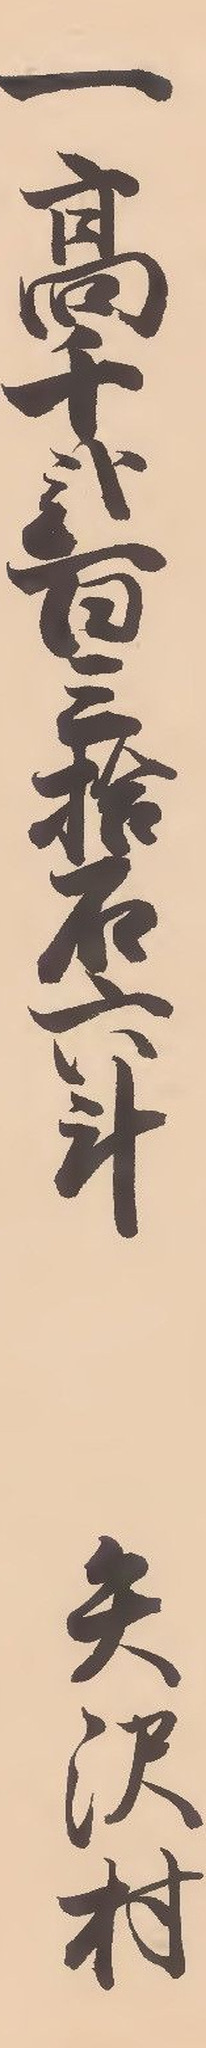一高千弐百三拾石六斗矢沢村
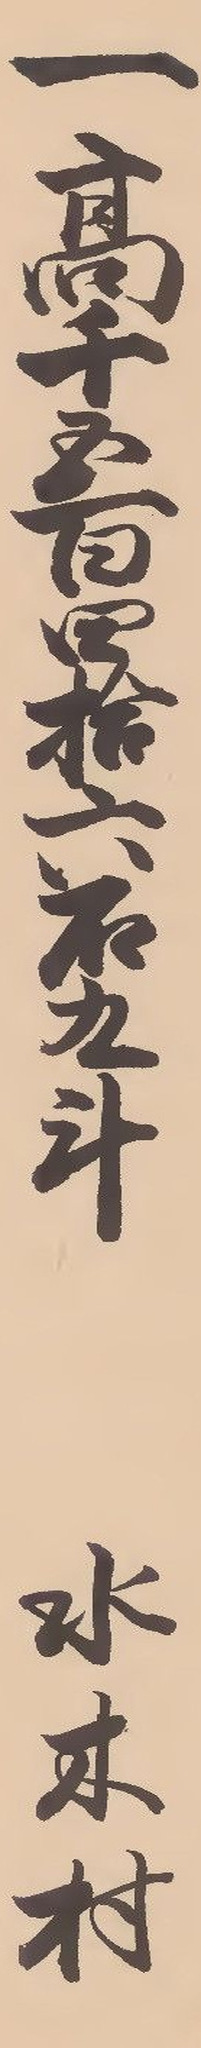一高千五百四拾六石九斗水木村
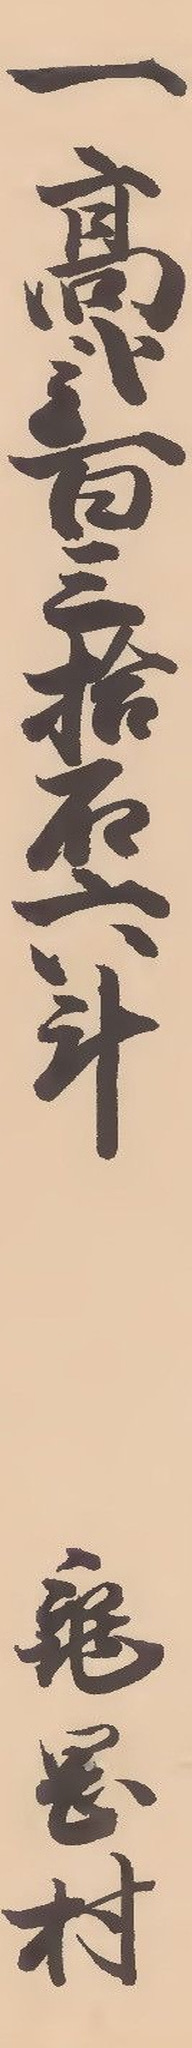一高弐百三拾石六斗亀岡村
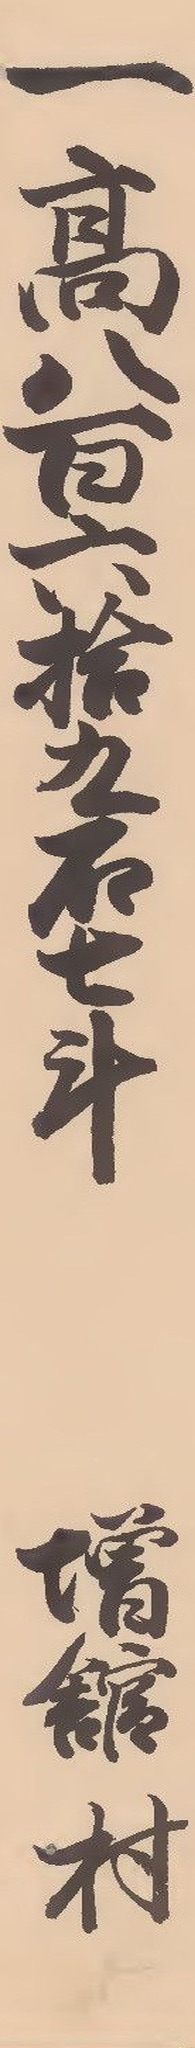一高八百六拾九石七斗増舘村

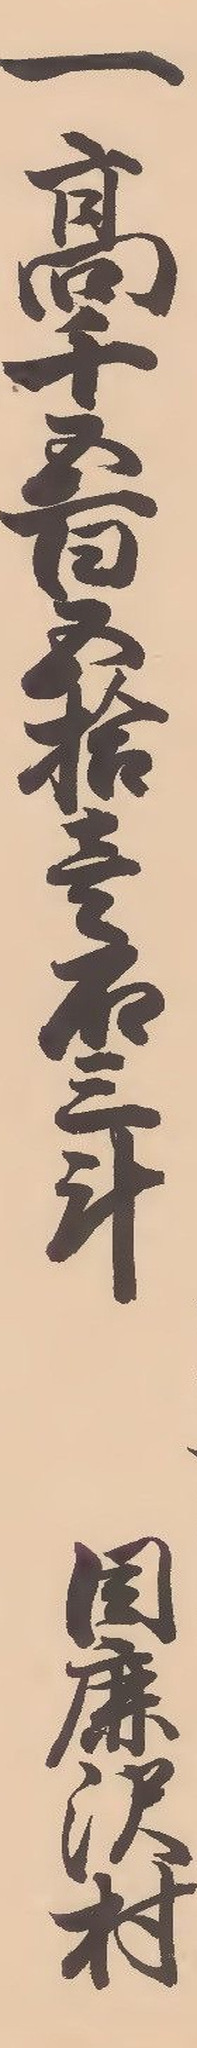一高千五百五拾壱石三斗目鹿沢村
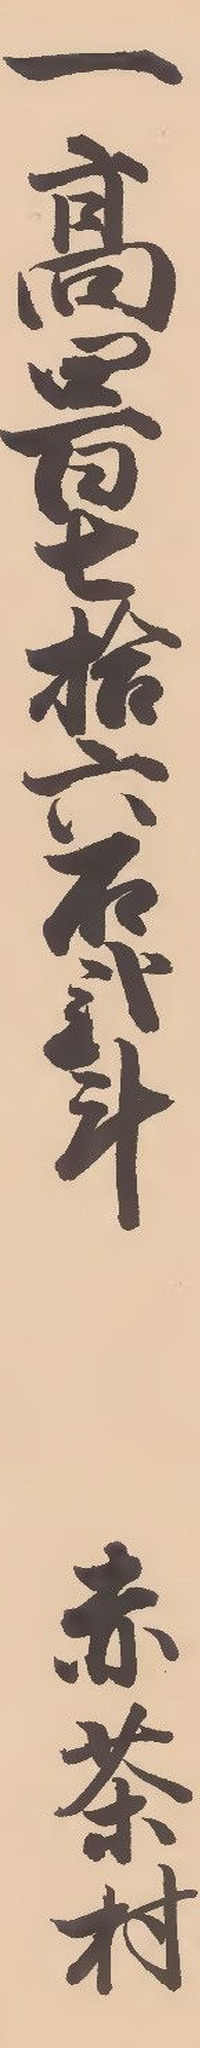一高四百七拾六石弐斗赤茶村
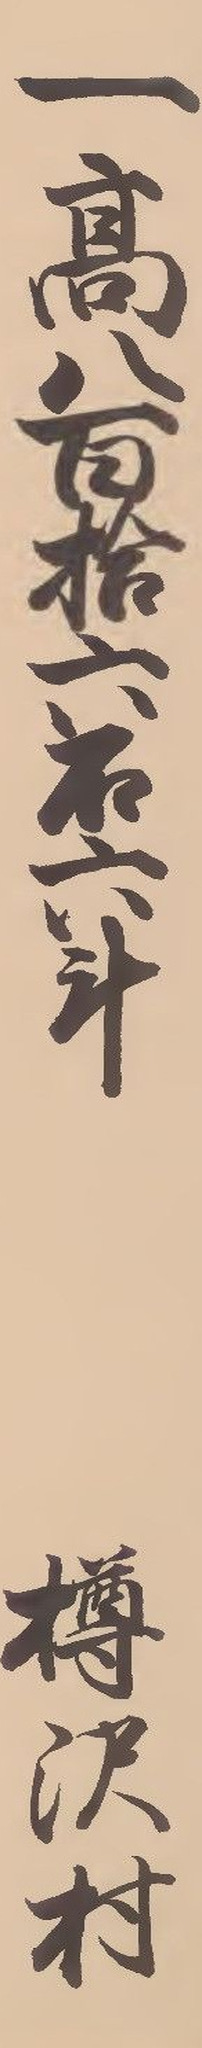一高八百拾六石六斗樽沢村
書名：陸奥国郷帳　７
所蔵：国立公文書館 National Archives of Japan
